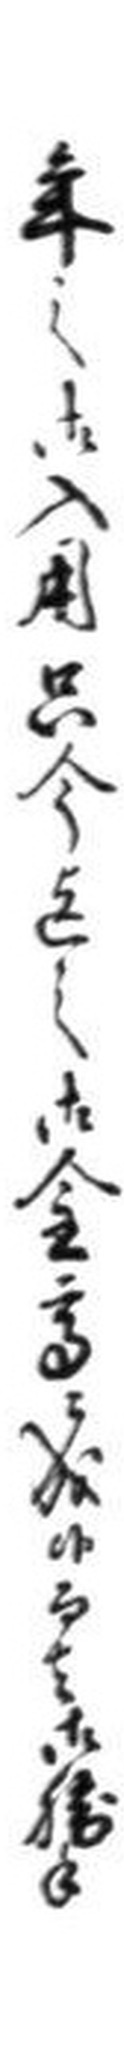年之御入用只今迄之御金高ニ成候而者御勝手
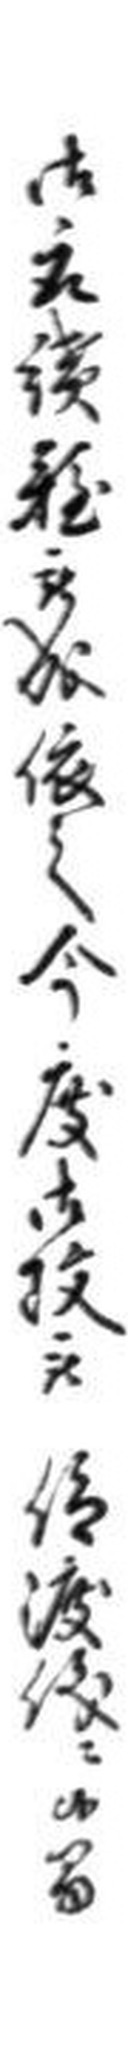御取続難被成依之今度御改被仰渡儀ニ候間
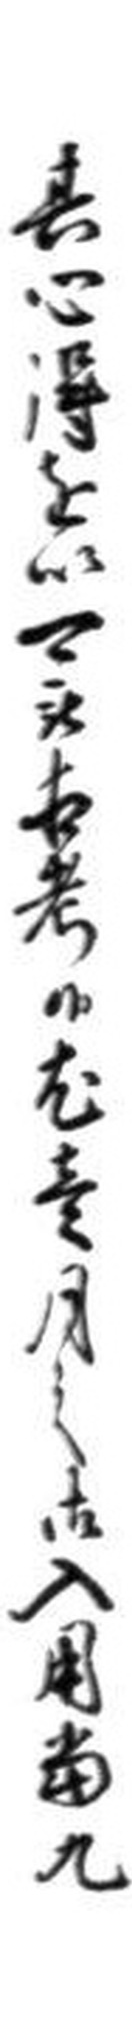其心得を以可被相考候尤壱月之御入用当九
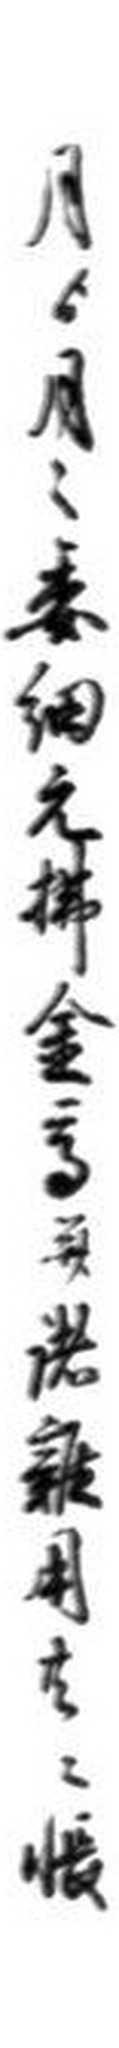月ゟ月々委細元払金高并諸雑用共ニ帳
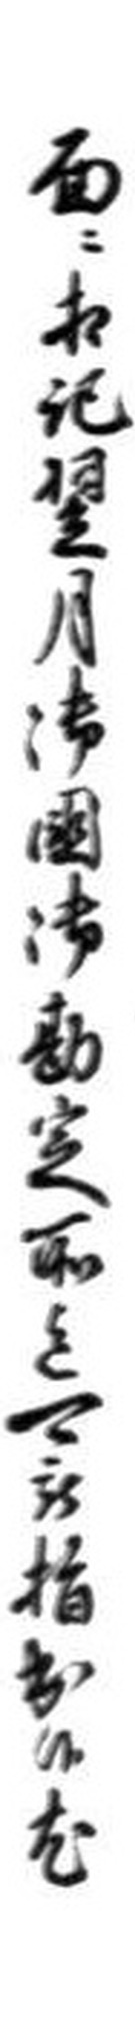面ニ相記翌月御国御勘定所迄可被指出候尤
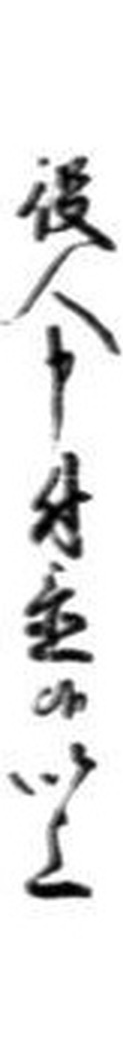役人申付置候以上
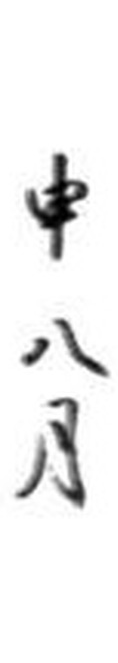申八月
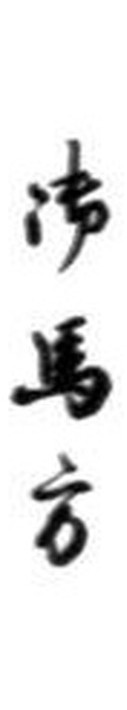御馬方
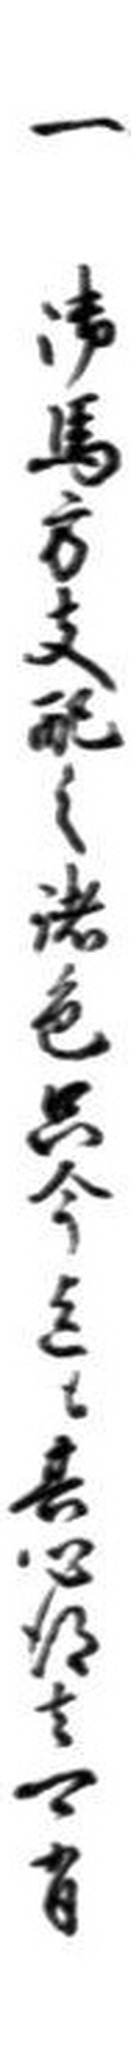一御馬方支配之諸色只今迄も其心得者可有
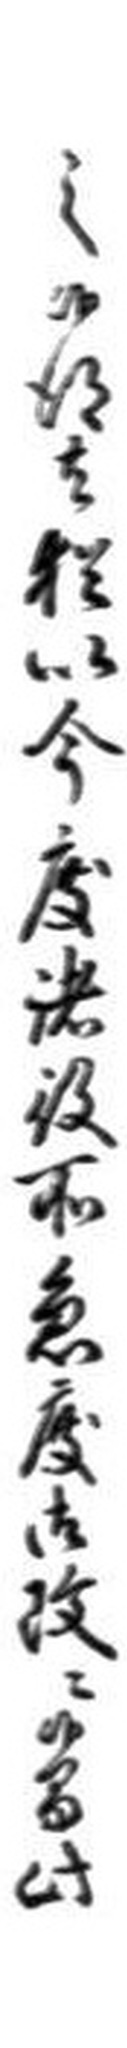之候得共猶以今度諸役所急度御改ニ候間此
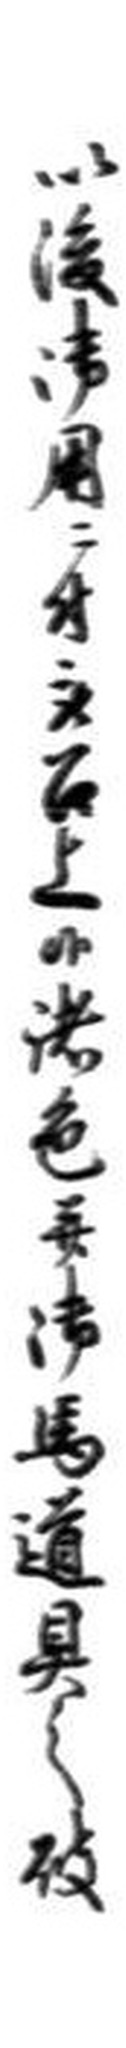以後御用ニ付被召上候諸色并御馬道具之破
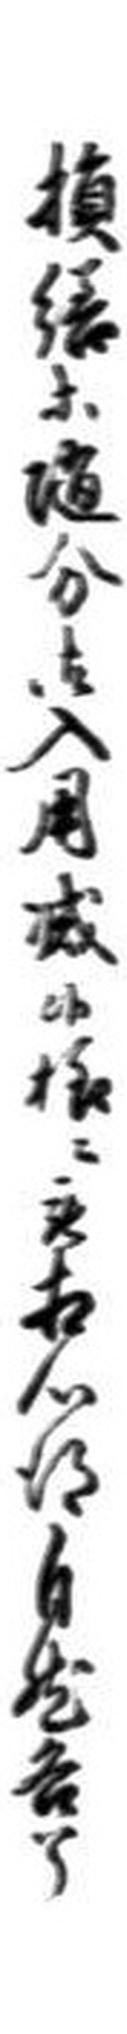損繕等随分御入用減候様ニ被相心得自然各了

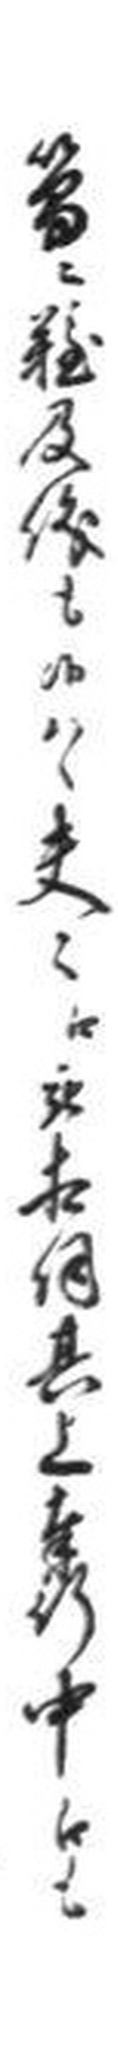簡ニ難及儀も候ハヽ夫々江被相伺其上奉行中江も
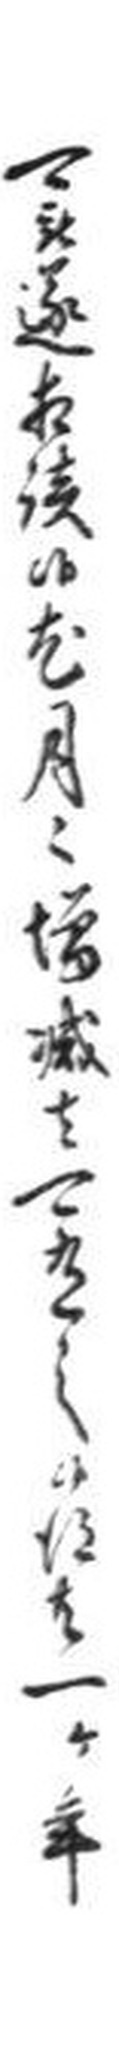可被遂相談候尤月々増減者可有之候得共一ヶ年
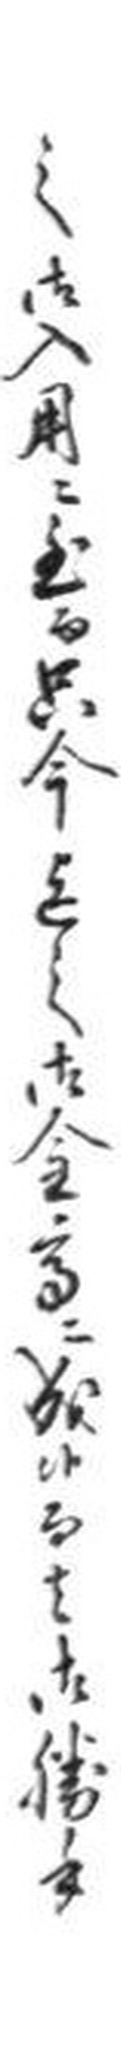之御入用ニ至而只今迄之御金高ニ成候而者御勝手
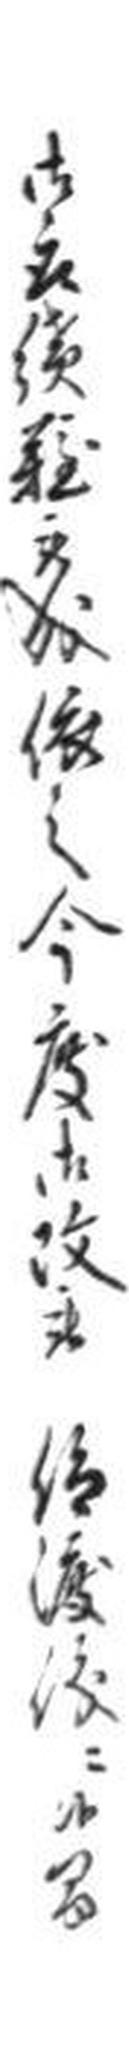御取続難被成依之今度御改被仰渡儀ニ候間
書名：家譜 三十一 吉邦公 享保元年
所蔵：福井県文書館 Fukui Prefectural Archives
